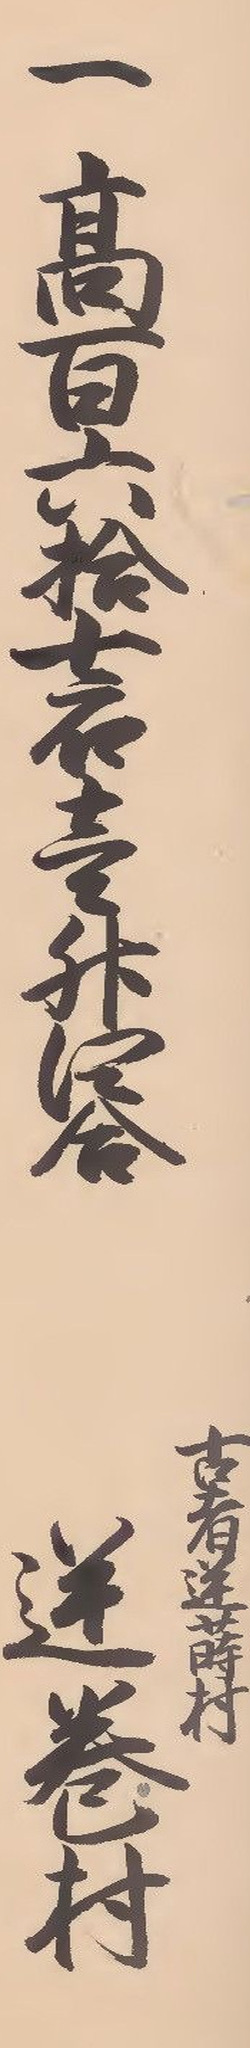一高百六拾七石壱升四合逆巻村
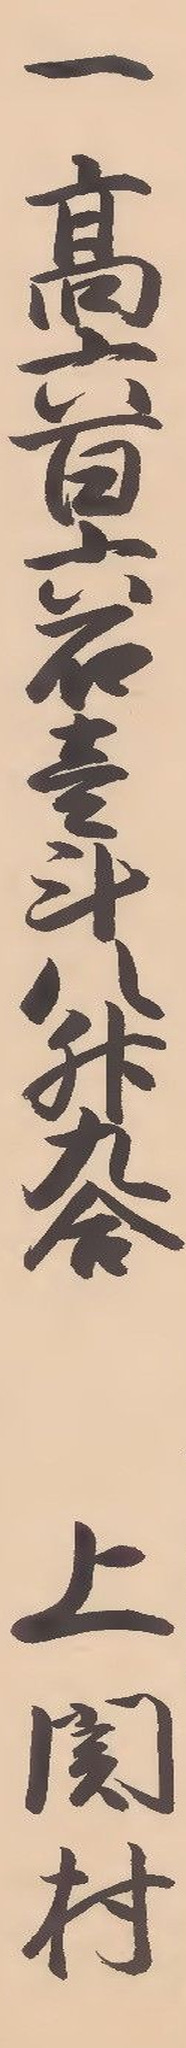一高六百六石壱斗八升九合上関村
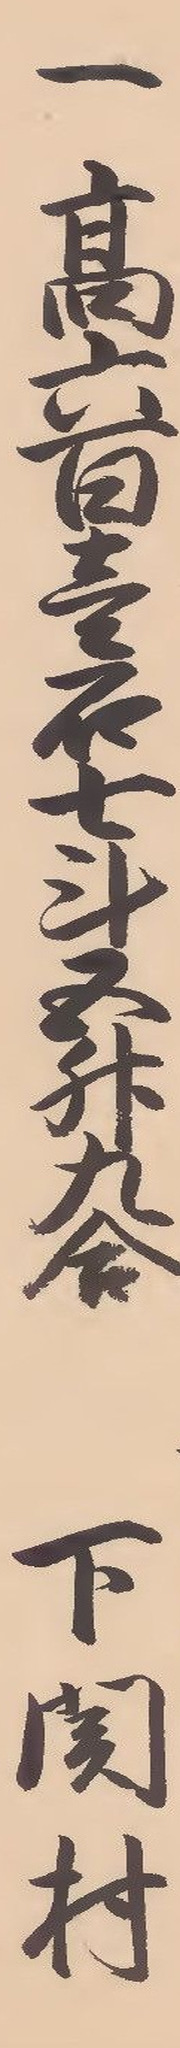一高六百壱石七斗五升九合下関村
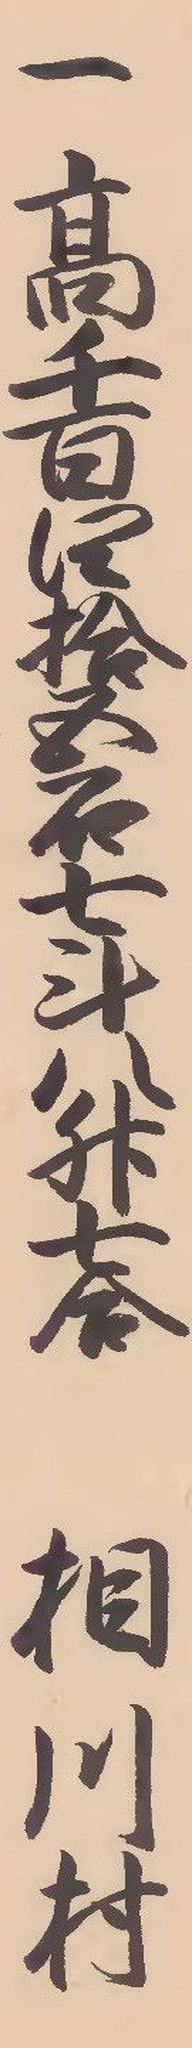一高千百四拾五石七斗八升七合相川村

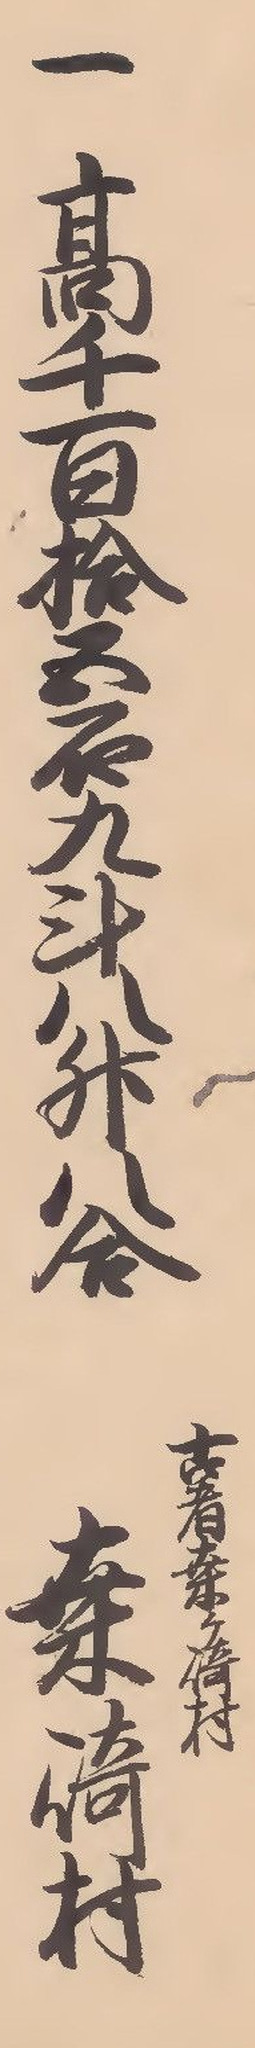一高千百拾五石九斗八升八合桑崎村
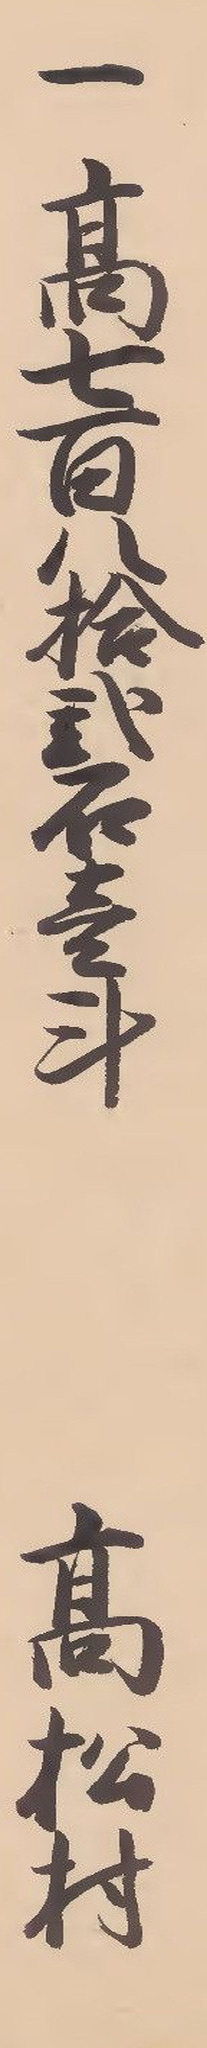一高七百八拾弐石壱斗高松村
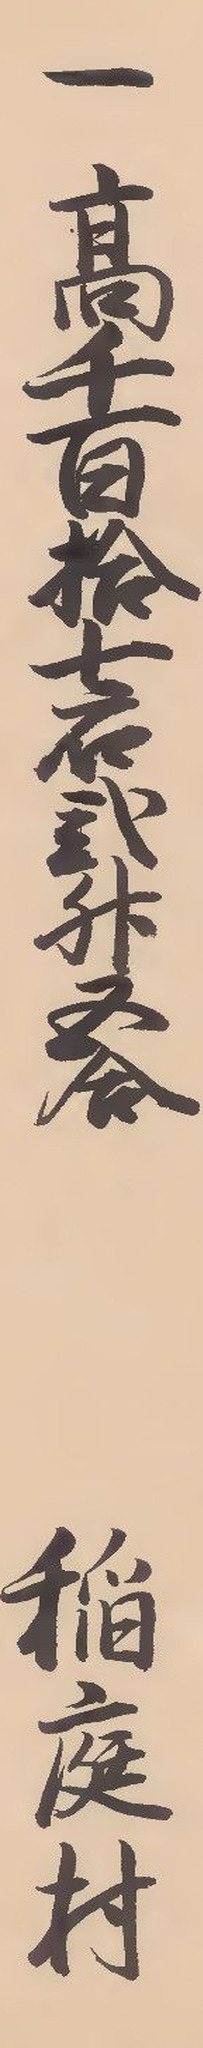一高千百拾七石弐升五合稲庭村
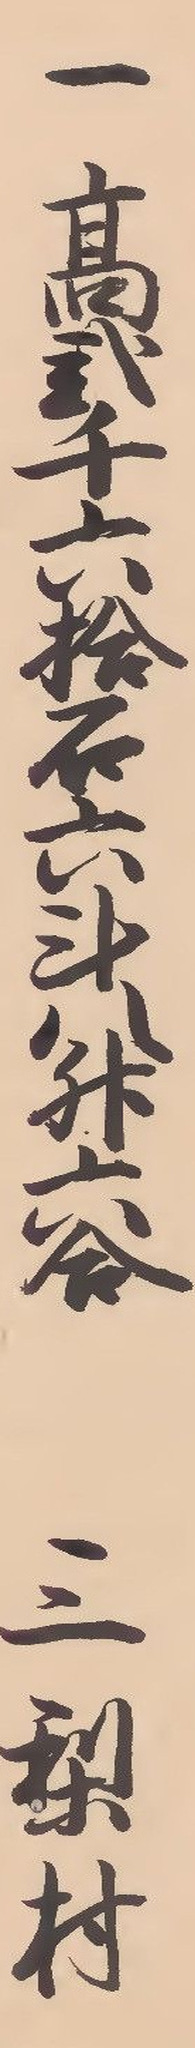一高弐千六拾石六斗八升六合三梨村
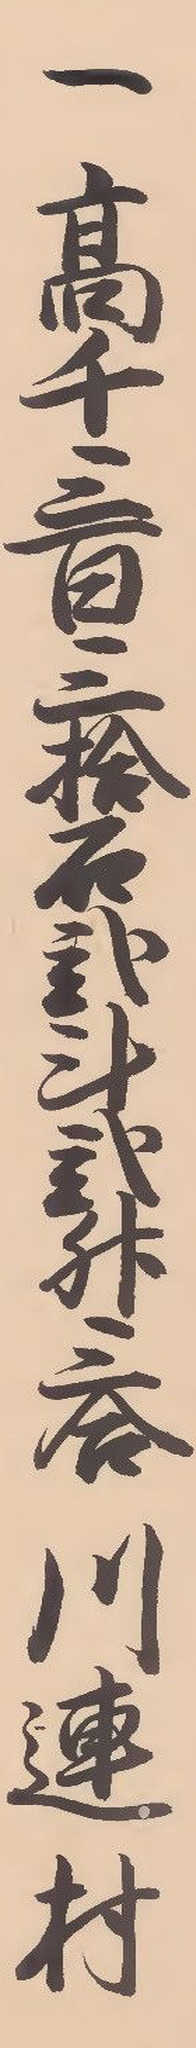一高千三百三拾石弐斗弐升三合川連村
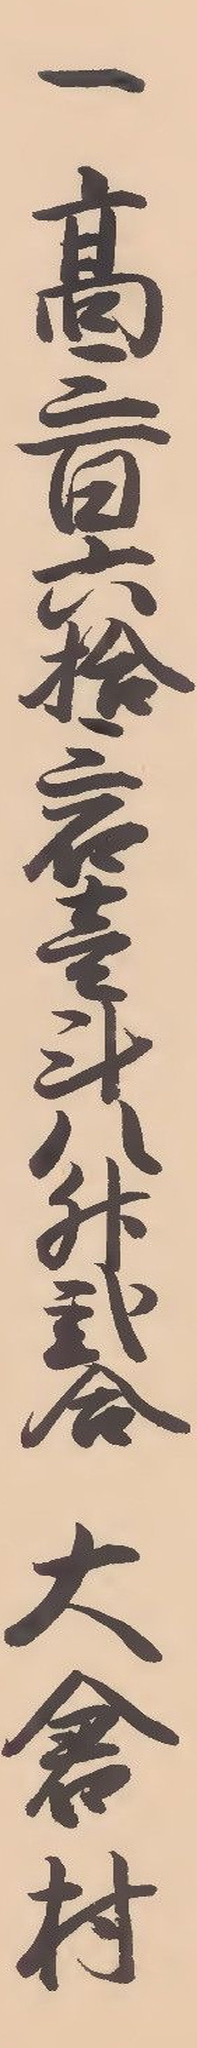一高三百六拾三石壱斗八升弐合大倉村
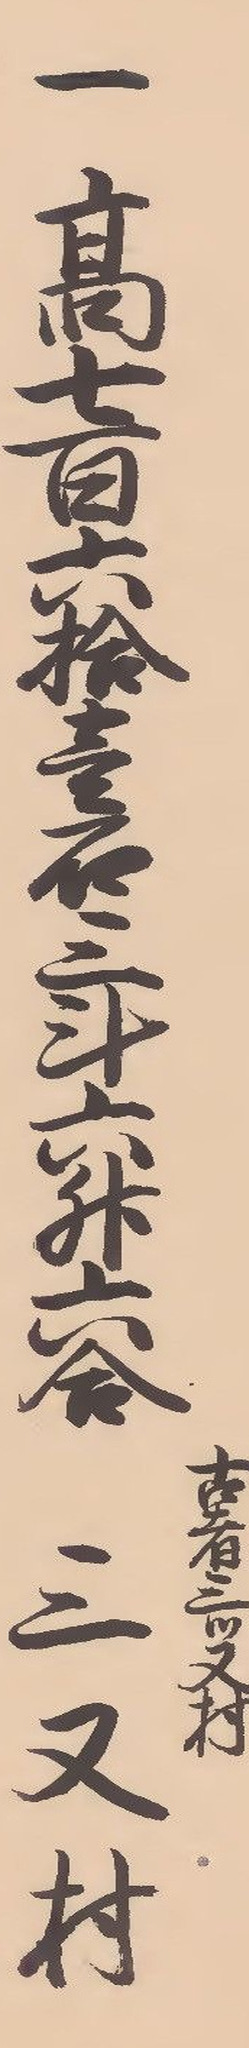一高七百六拾壱石三斗六升六合三又村
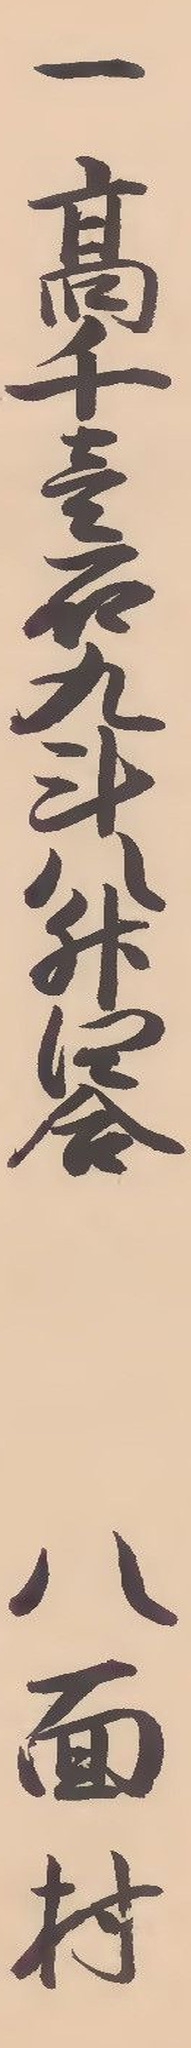一高千壱石九斗八升四合八面村

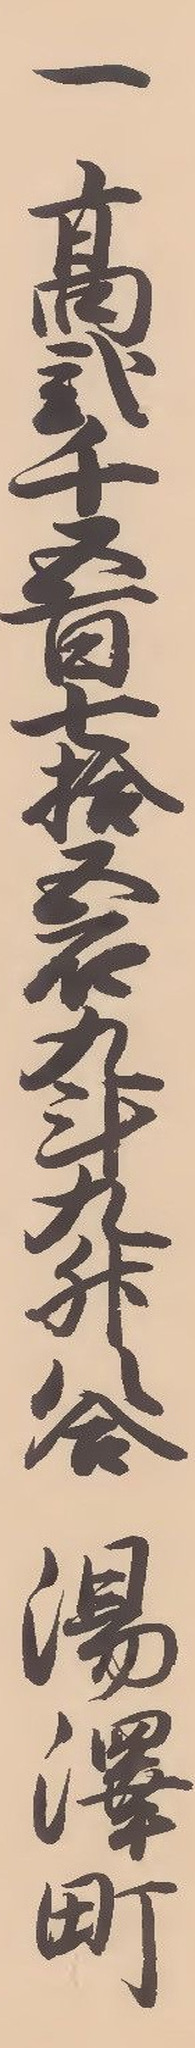一高弐千五百七拾五石九斗九升八合湯沢町
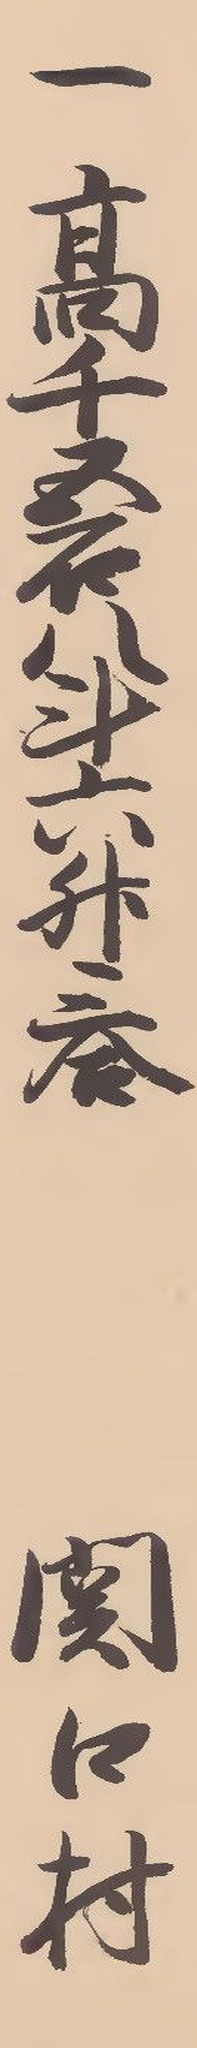一高千五石八斗六升三合関口村
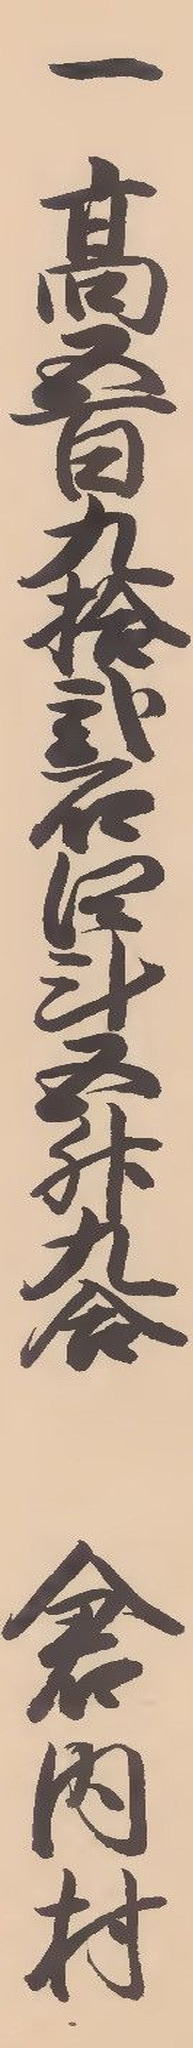一高五百九拾弐石四斗五升九合倉内村
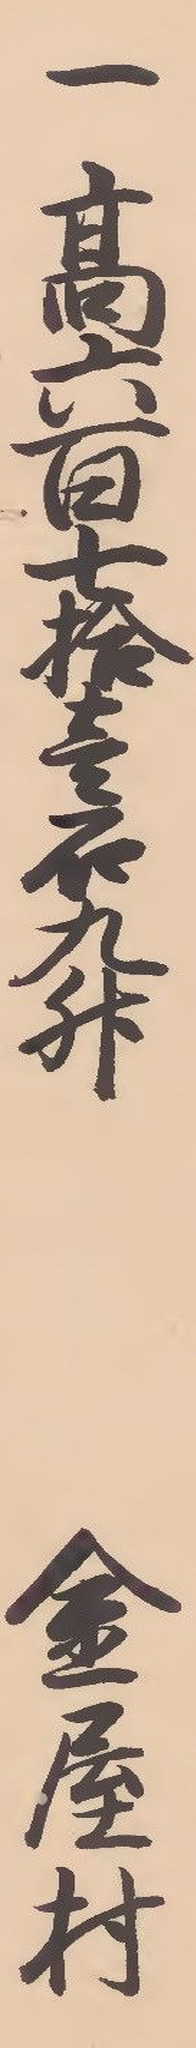一高六百七拾壱石九升金屋村
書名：出羽国郷帳　５
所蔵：国立公文書館 National Archives of Japan
